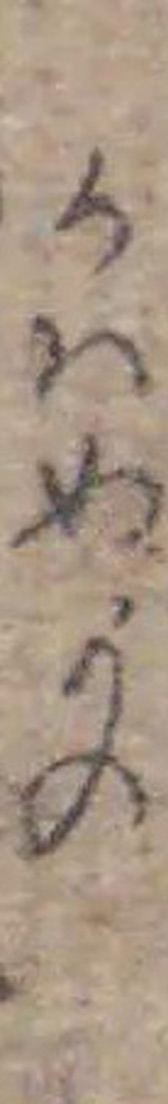かはぬもの
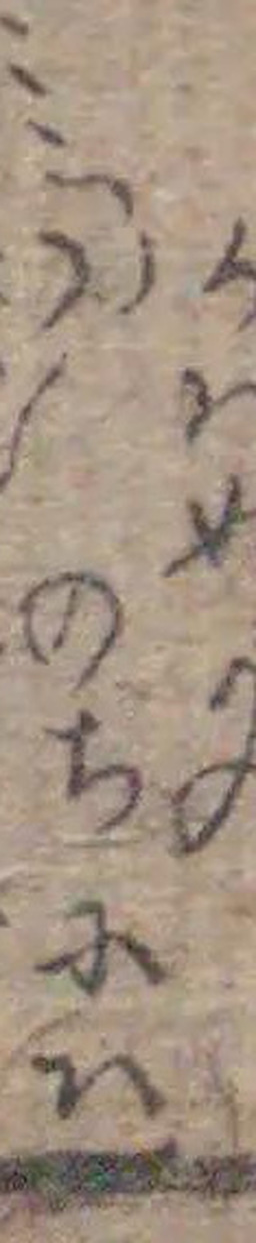のちには
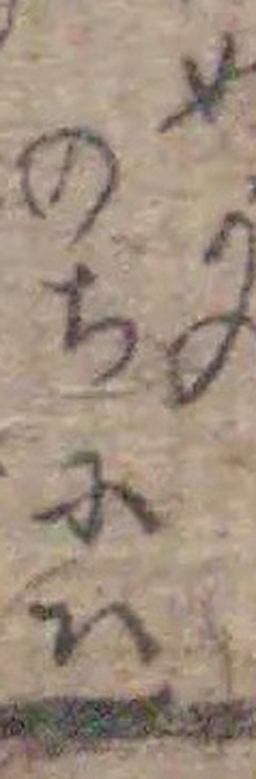のちには
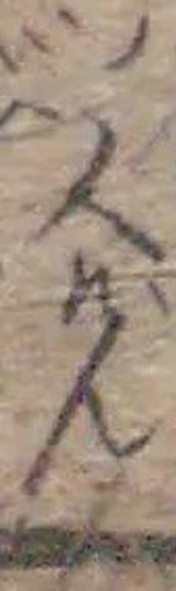人げん
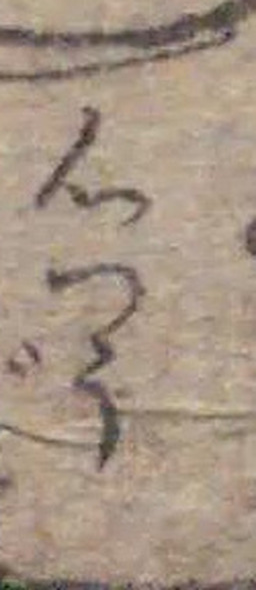心つう
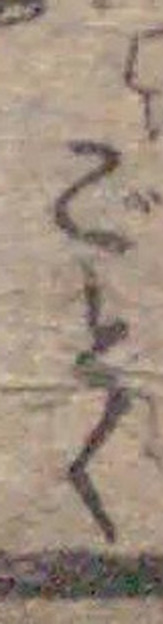ごとく
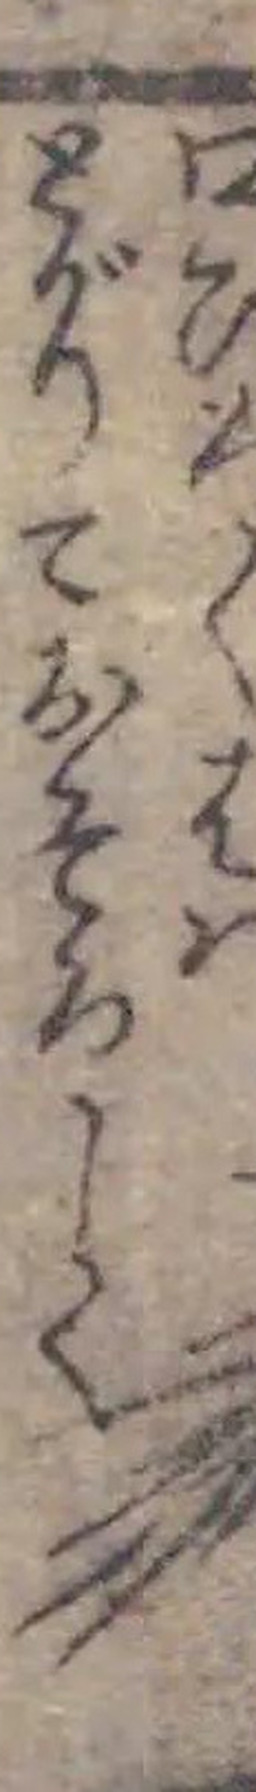とがりておそろしく
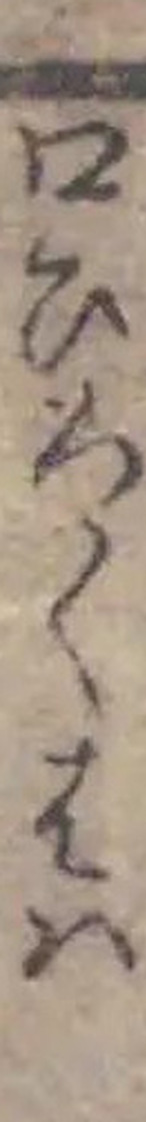口ひろくはは
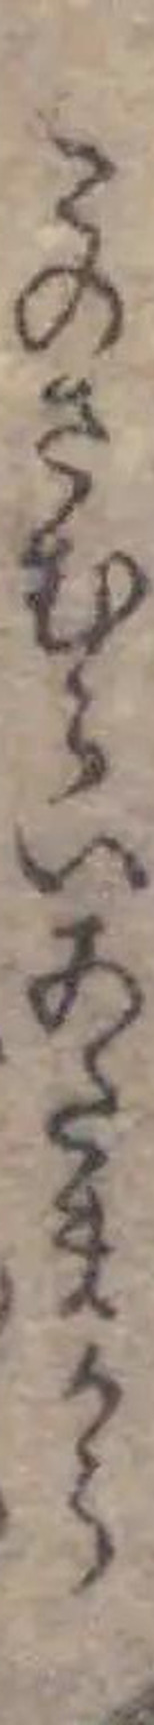このさむらいあたまから

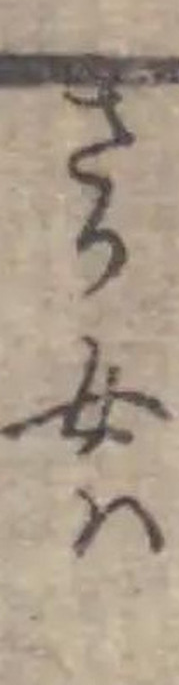さか女は
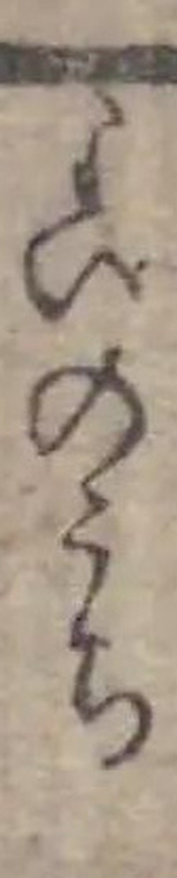よいのうち
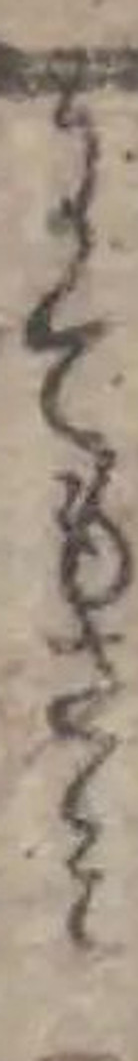にてもさみ
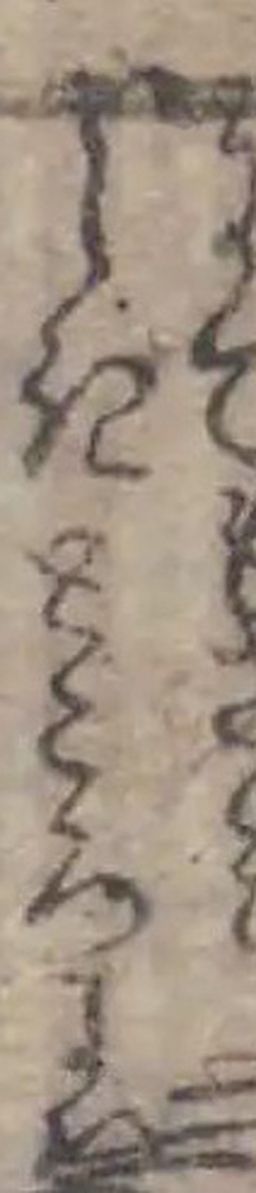しきところには
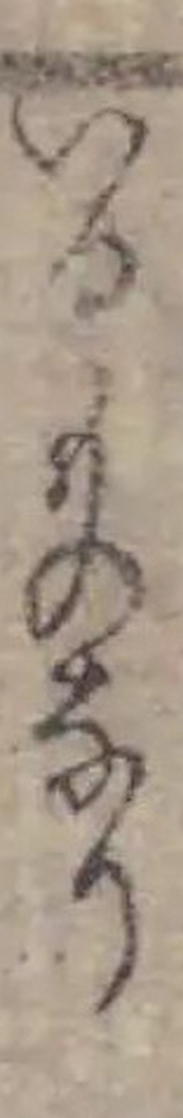いるものなり
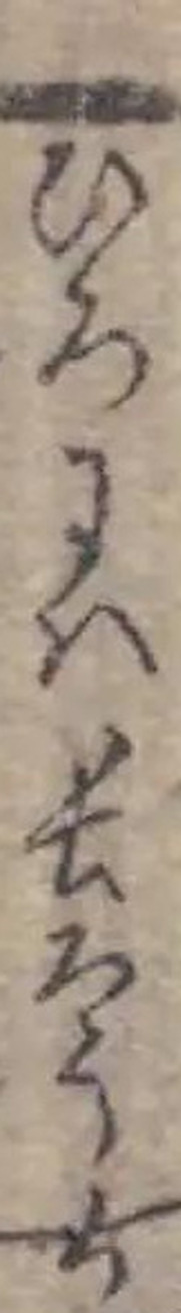ひろには長ろうか
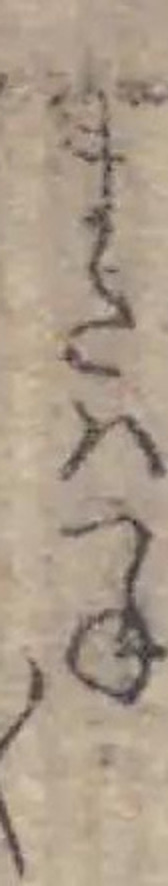またはつね
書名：夭怪着到牒 2巻
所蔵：国立国会図書館 National Diet Library, JAPAN
